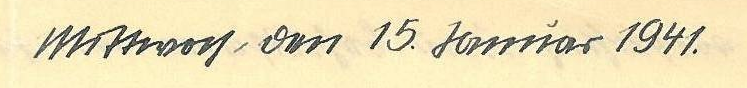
Mittwoch, den 15. Januar 1941.
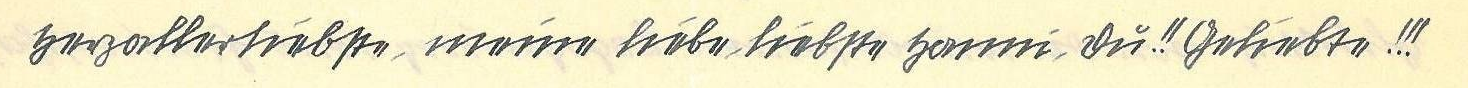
Herzallerliebste, meine liebe, liebste, Du!! Geliebte!!!
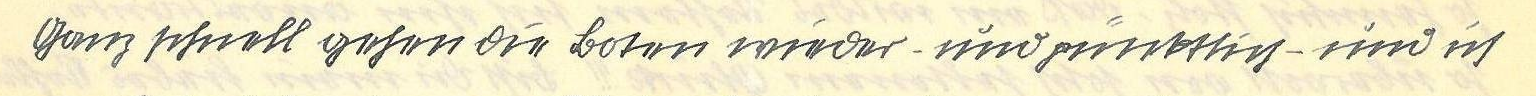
Ganz schnell gehen die Boten wieder – und pünktlich – und ich
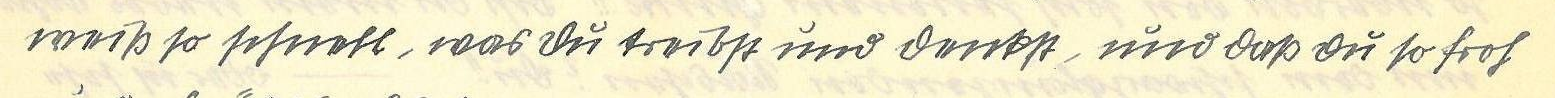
weiß so schnell, was Du treibst und denkst, und daß Du so froh
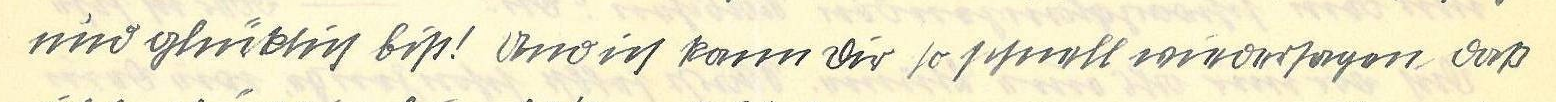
und glücklich bist! Und ich kann Dir so schnell wiedersagen, daß
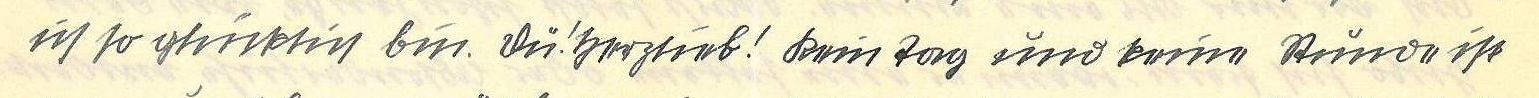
ich so glücklich bin. Du! Herzlieb! Kein Tag und keine Stunde ist
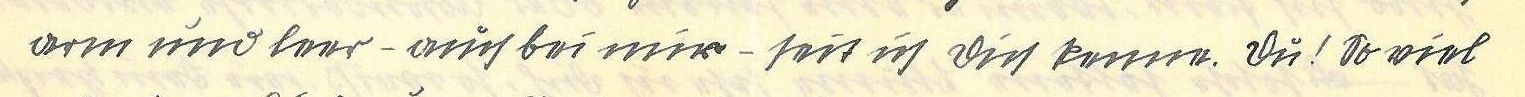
arm und leer – auch bei mir – seit ich Dich kenne. Du! So viel
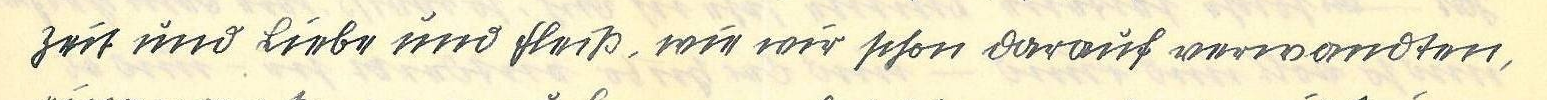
Zeit und Liebe und Fleiß, wie wir schon darauf verwandten,
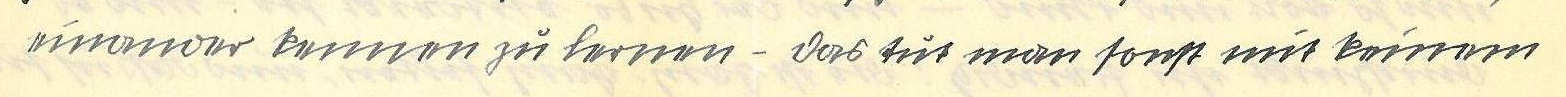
einander kennen zu lernen – das hat man sonst mit keinem
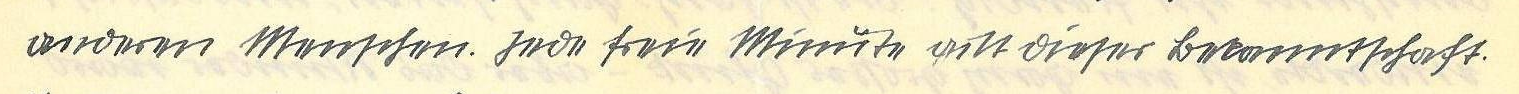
anderen Menschen. Jede freie Minute gilt dieser Bekanntschaft.
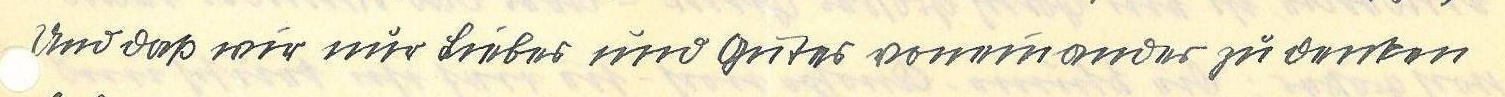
Und daß wir nur Liebes und Gutes voneinander zu denken
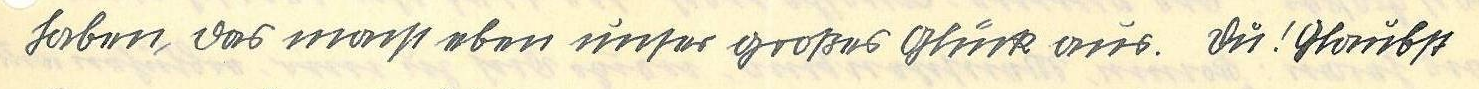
haben, das macht eben unser großes Glück aus. Du! Glaubst
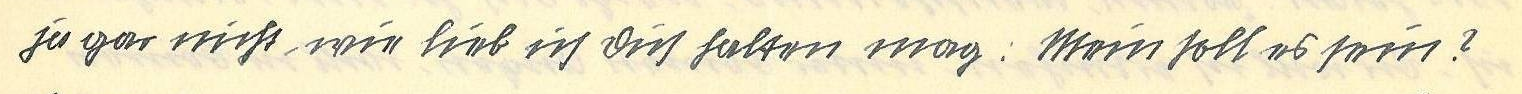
ja gar nicht, wie lieb ich Dich halten mag: Mein soll es sein?
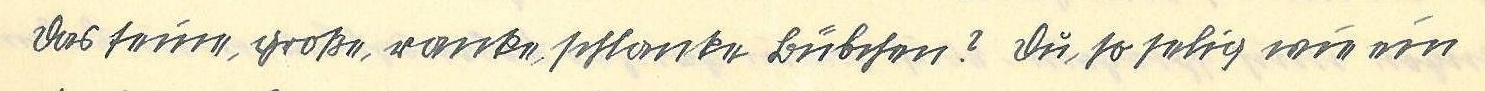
Das feine, große, ranke, schlanke Bübchen? Du, so selig wie ein
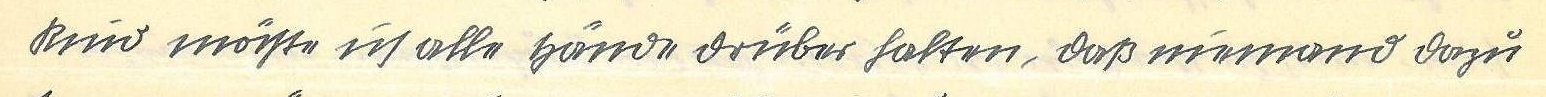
Kind möchte ich alle Hände drüber halten, daß niemand dazu
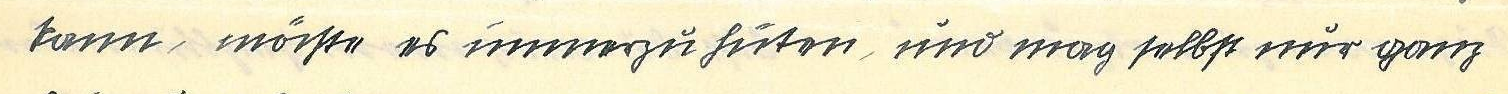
kann, möchte es immerzu hüten, und mag selbst nur ganz
